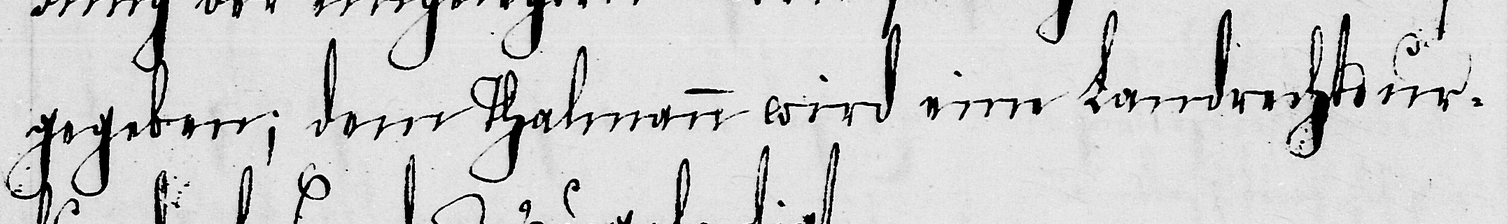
gegeben; dem Thalmann wird eine Landrechtsur¬
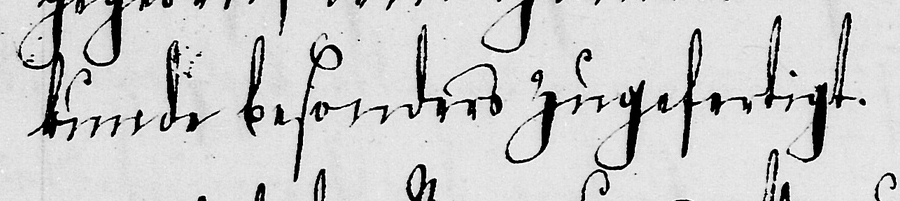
kunde besonders zugefertigt.
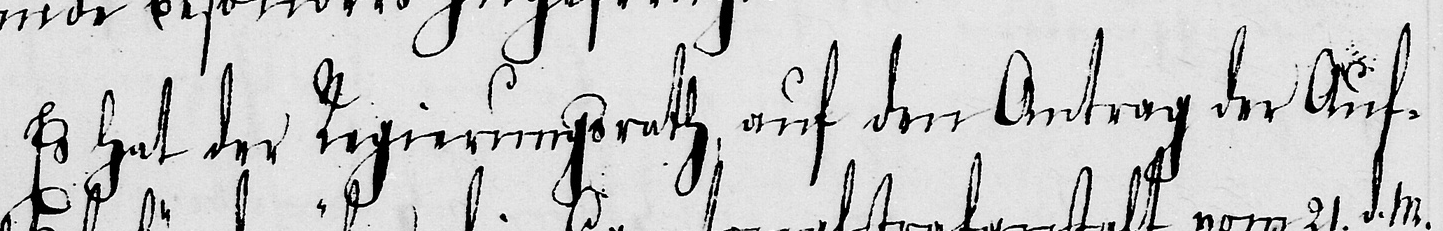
Es hat der Regierungsrath, auf den Antrag der Auf¬
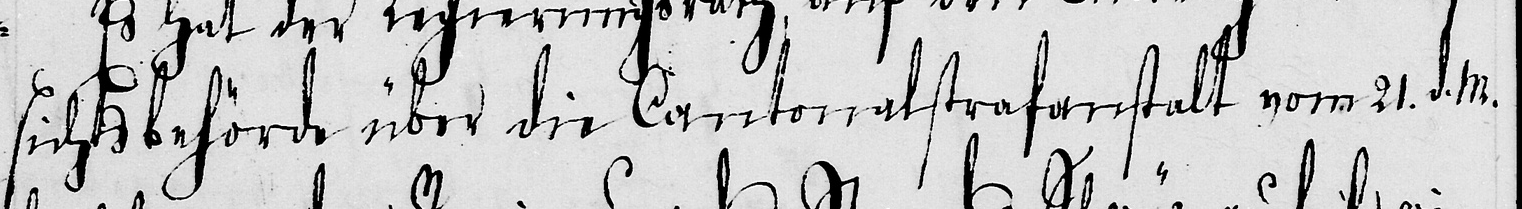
sichtsbehörde über die Cantonalstrafanstalt vom 21. d.
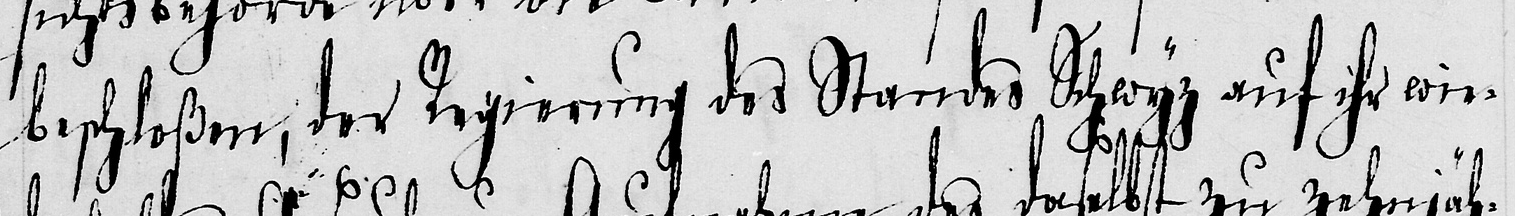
beschloßen, der Regierung des Standes Schwyz auf ihr wie¬
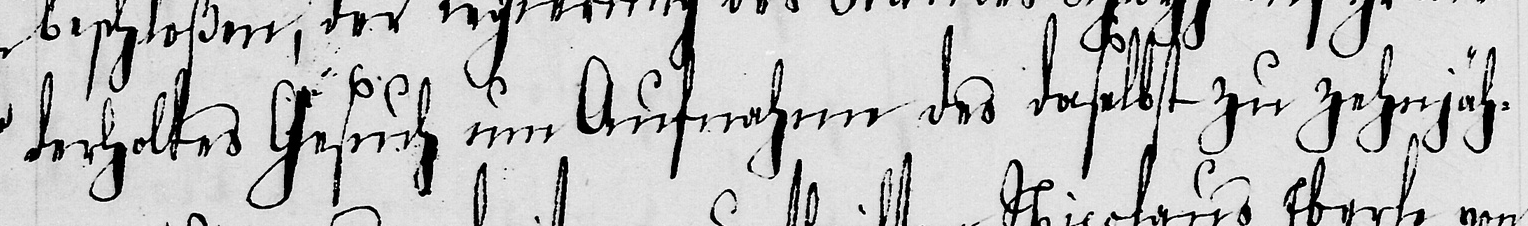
derholtes Gesuch um Aufnahme des daselbst zu zehnjäh¬
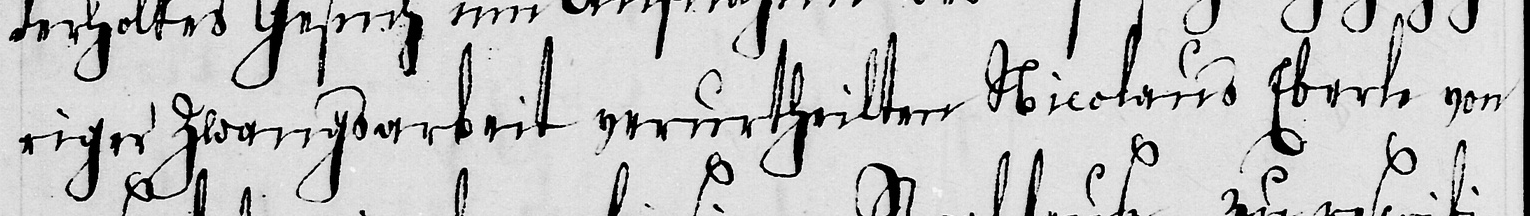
riger Zwangsarbeit verurtheilten Nicolaus Eberle von
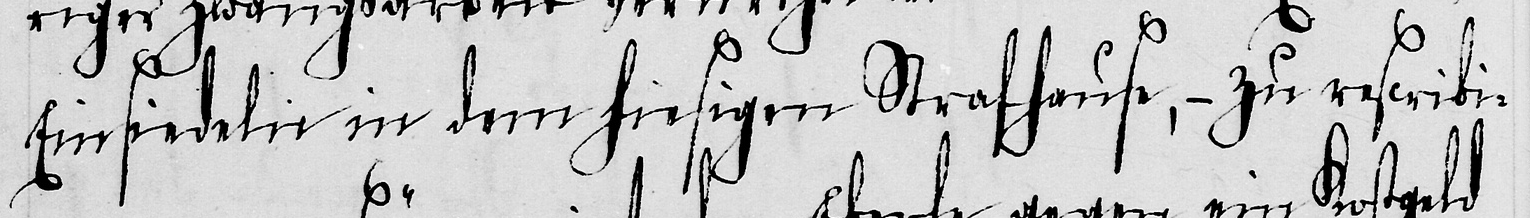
Einsiedeln in dem hiesigen Strafhause, – zu rescribi¬
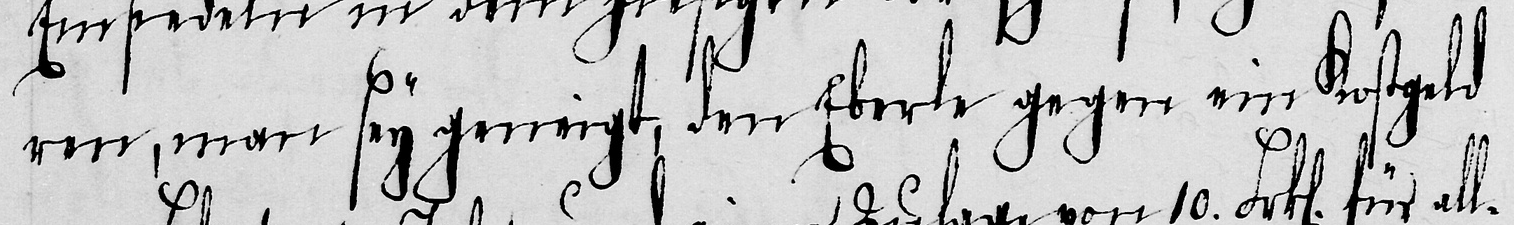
ren, man sey geneigt, den Eberle gegen ein Kostgeld
